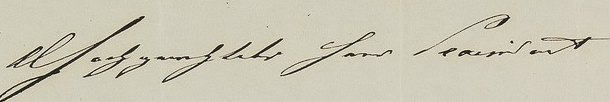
MHochgeachteter Herr Præsident
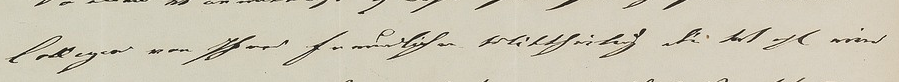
Collegen von Ihrer freundlichen Mittheilung die Wahl eines
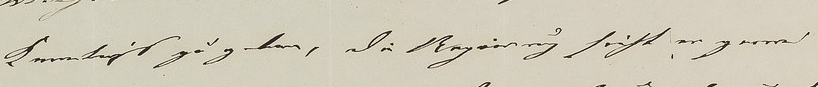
Kenntniß zu geben, die Regierung sieht es gerne
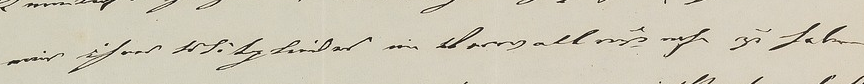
eines ihrer Mitglieder im Verwaltungsrathe zu haben
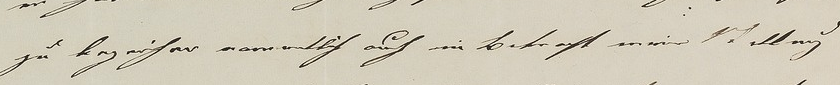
zu bezeichnen namentlich auch in Betracht meiner Stellung
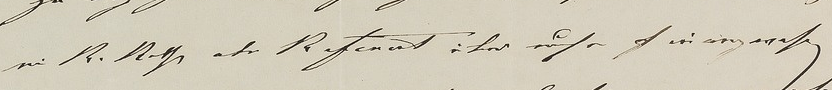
im R.Rathe als Referent über unser Finanzwesen.
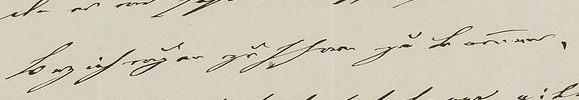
Beziehungen zu Ihnen zu kommen.
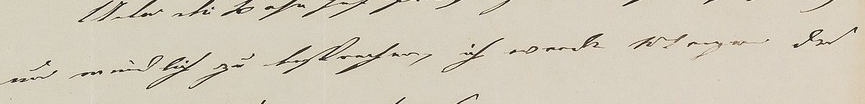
uns mündlich zu besprechen, ich werde Morgen der
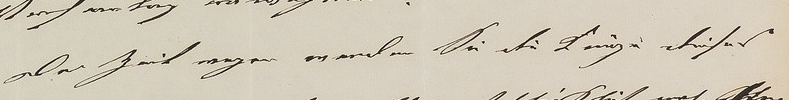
Der Zeit wegen werden Sie die Kürze dieses
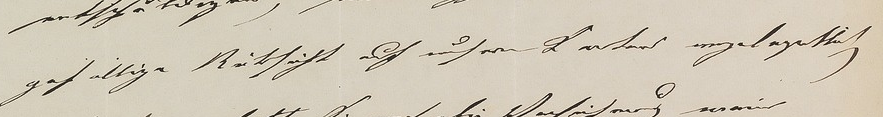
gefällige Rüksicht auf unsern Kanton angelegentlich
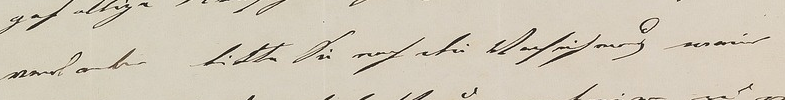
verdanke bitte Sie noch die Versicherung meiner
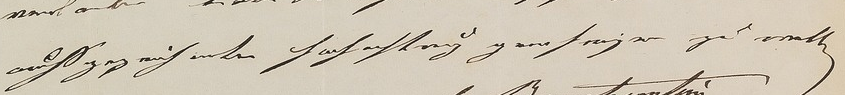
außgezeichneten Hochachtung genehmigen zu wollen
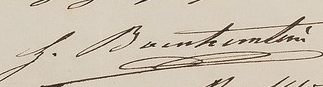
G. Boeschenstein
